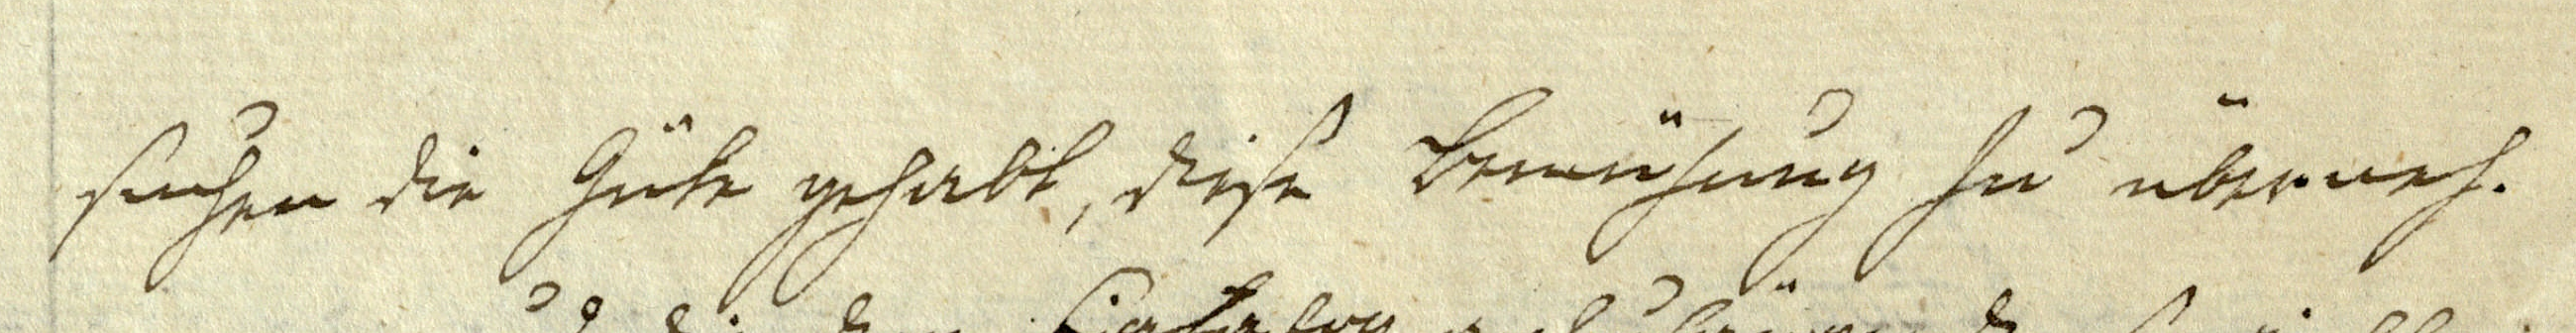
suchen die Güte gehabt, diese Bemühung zu überneh¬
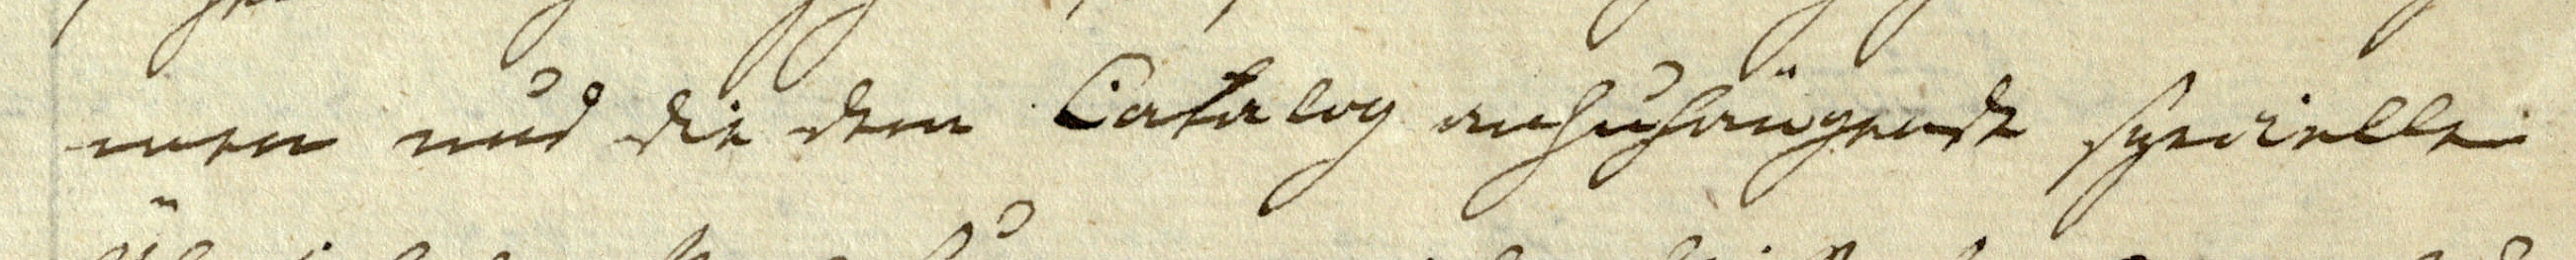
men und die dem Catalog anzuhängende specielle
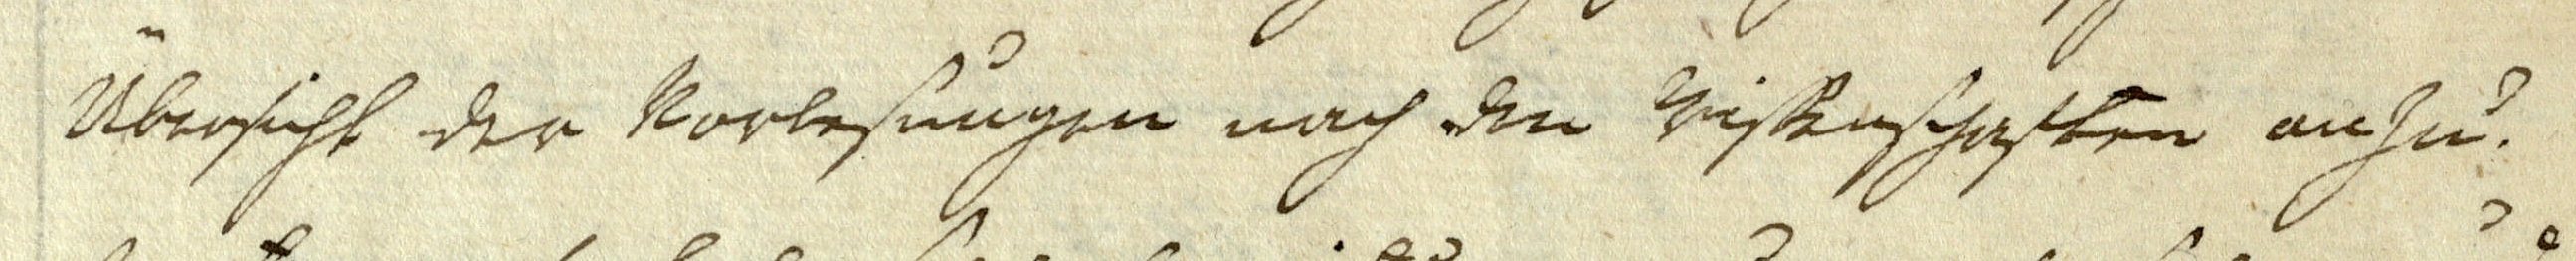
Übersicht der Vorlesungen nach den Wissenschaften anzu¬
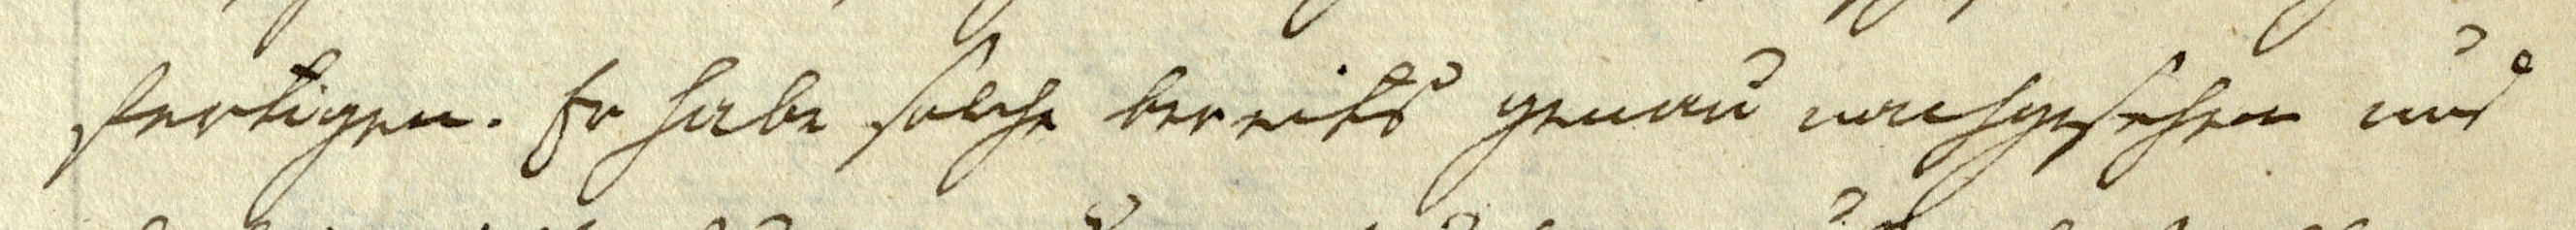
fertigen. Er habe solche bereits genau nachgesehen und
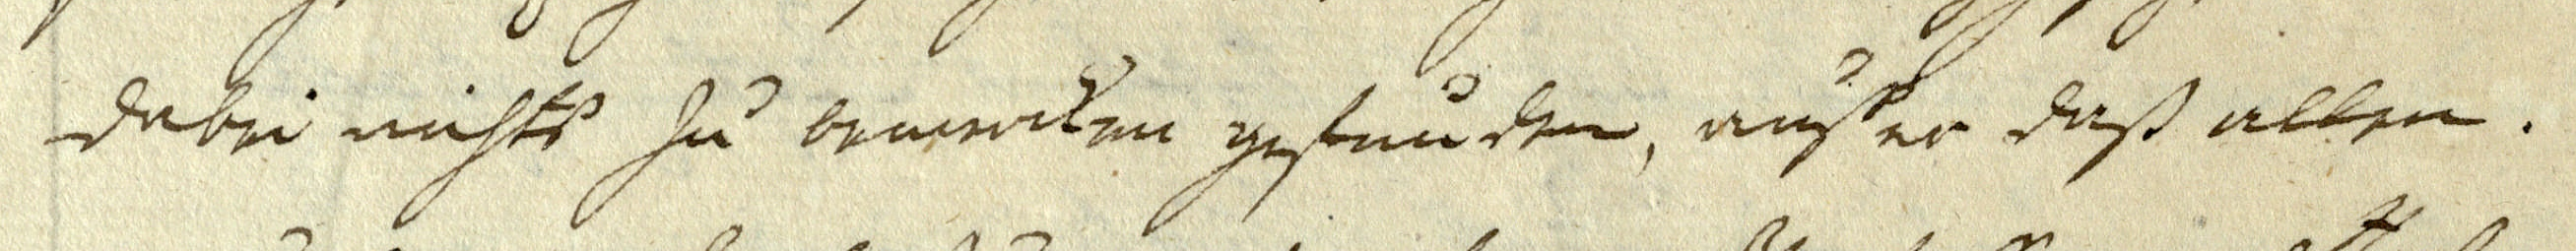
dabei nichts zu bemercken gefunden, ausser daß allen¬
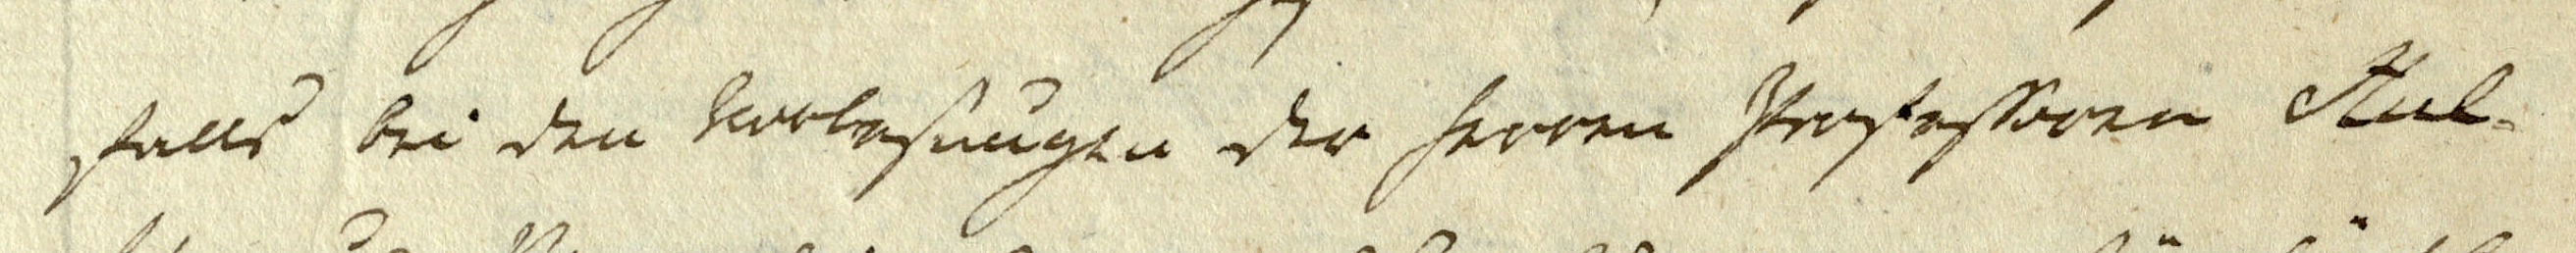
falls bei den Vorlesungen der Herren Professoren Hul¬
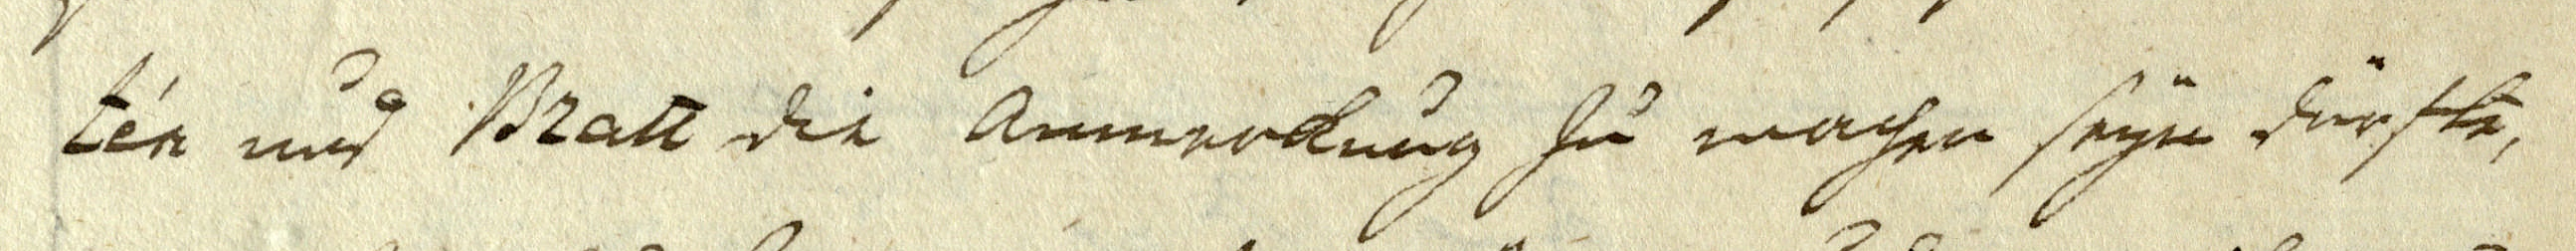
tén und Bratt die Anmerkung zu machen seÿn dürfte,
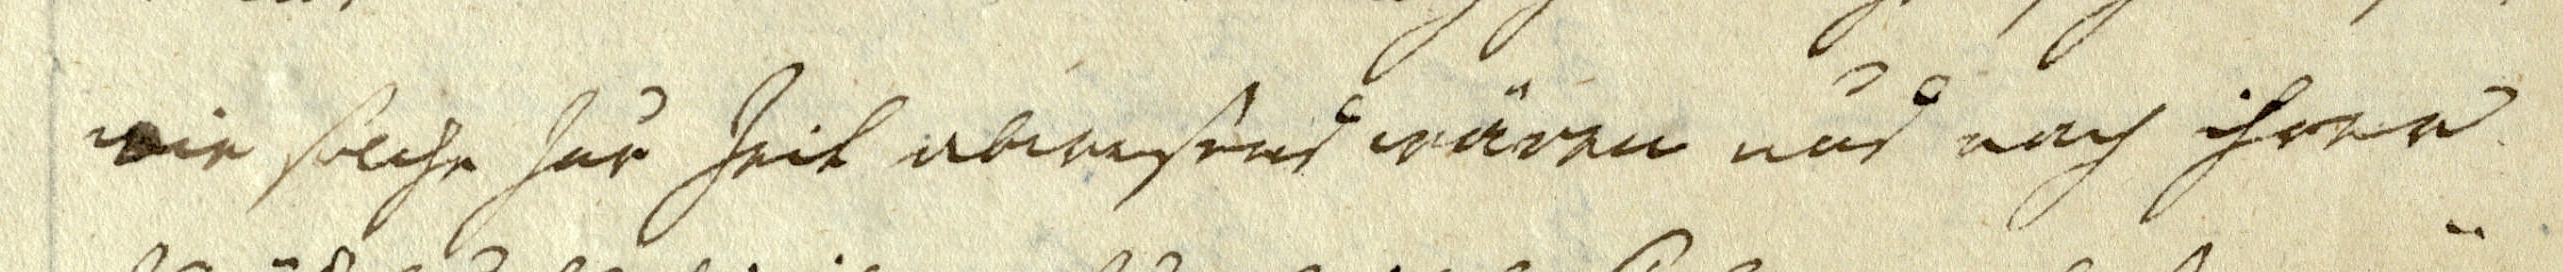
wie solche zur Zeit abwesend wären und nach ihrer
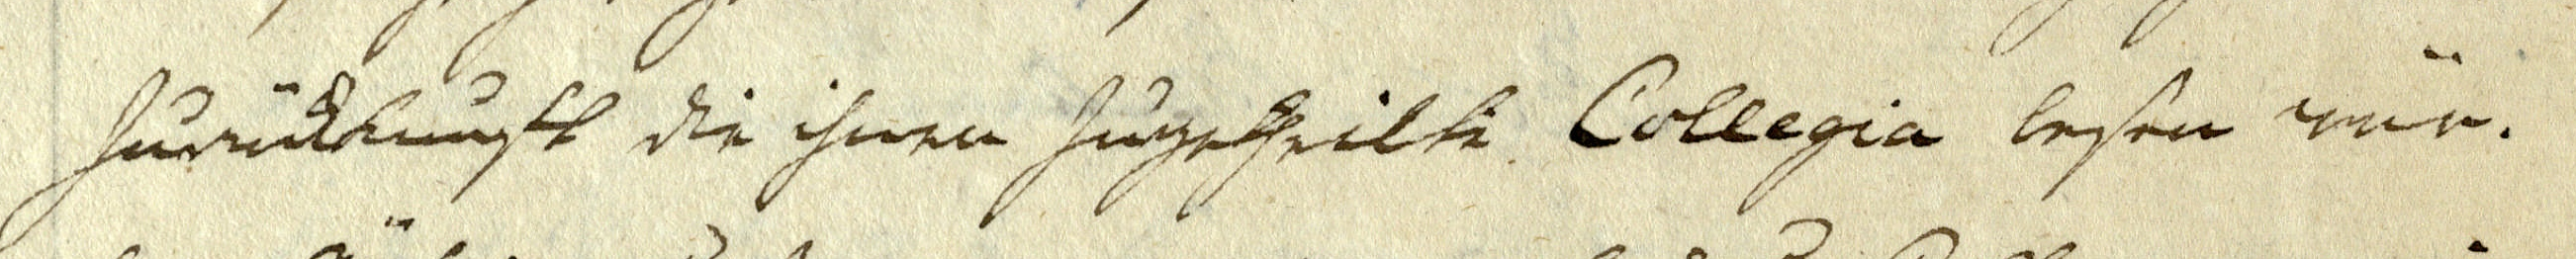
Zurückkunft die ihnen zugetheilte Collegia lesen wür¬
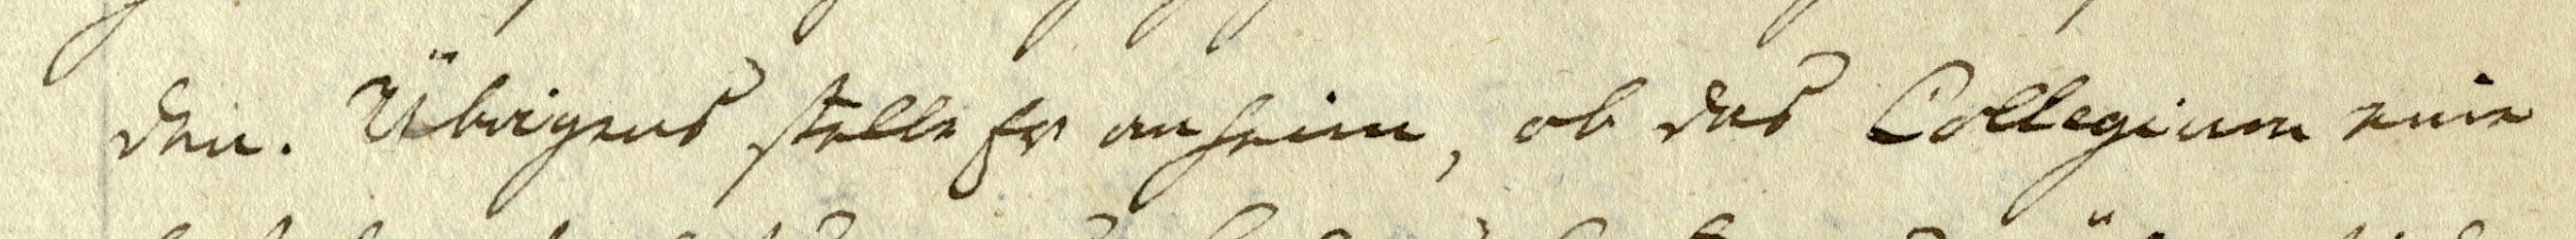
den. Übrigens, stelle Er anheim, ob das Collegium eine
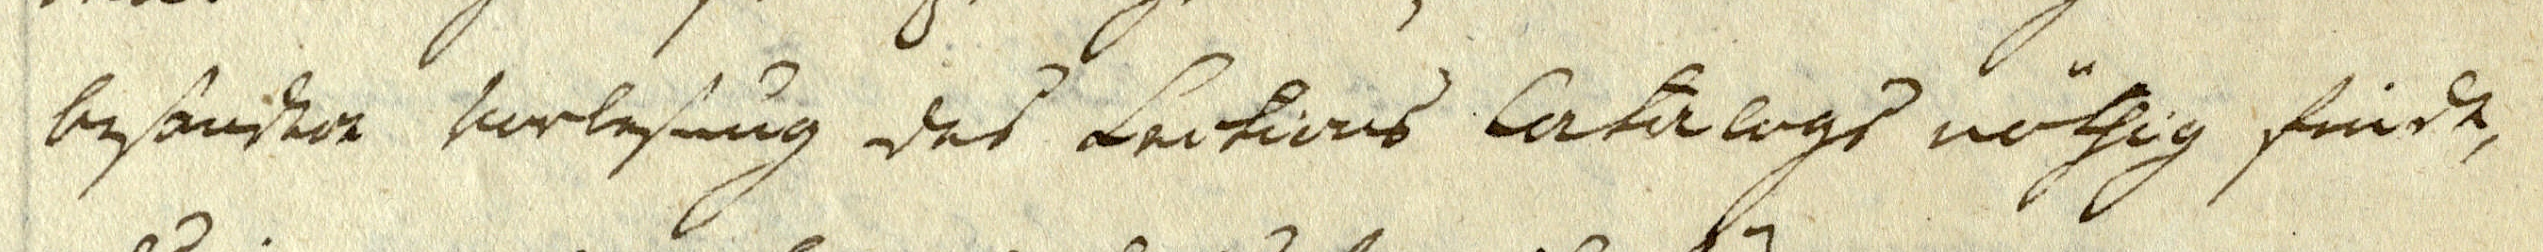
besondere Vorlesung des Lections Catalogs nöthig finde,
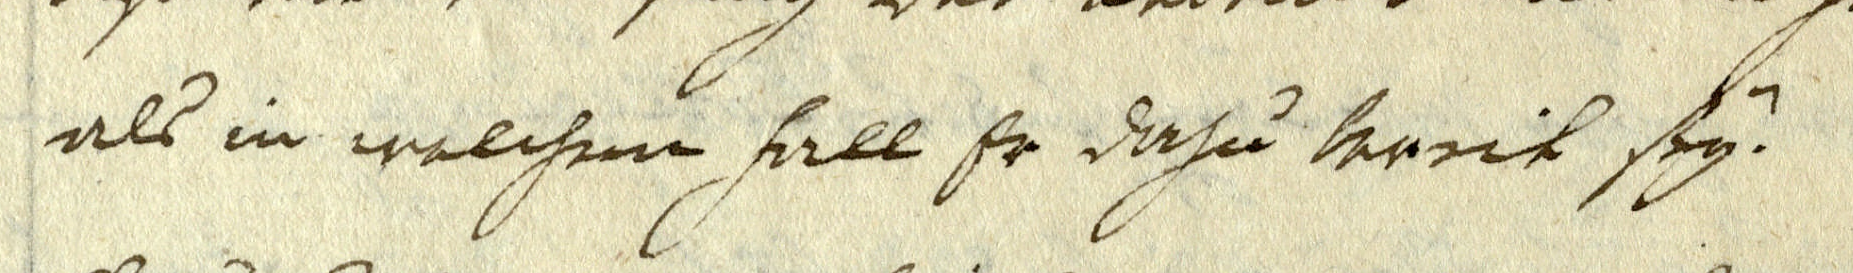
als in welchem Fall Er dazu bereit seÿ.
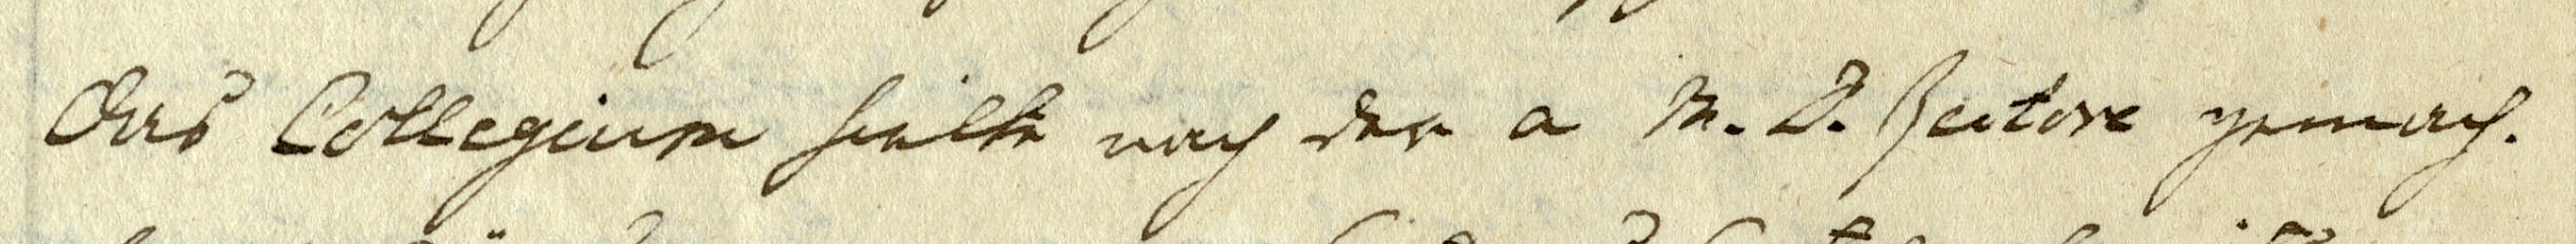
Das Collegium hielte nach der a M. D. Rectore gemach¬
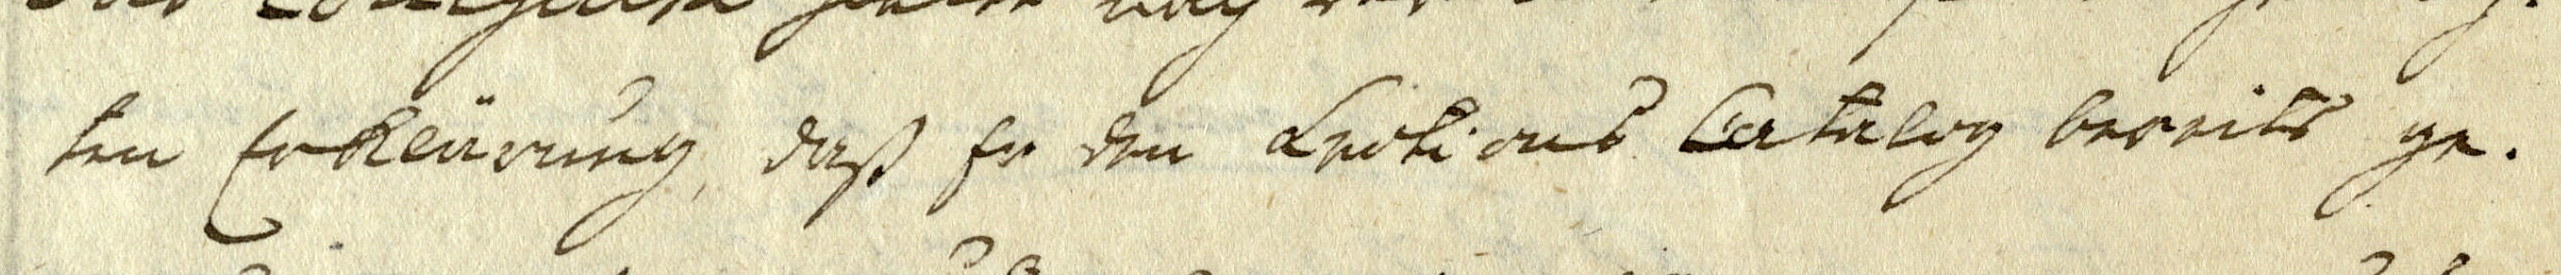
ten Erklärung, daß Er den Lections Catalog bereits ge¬
